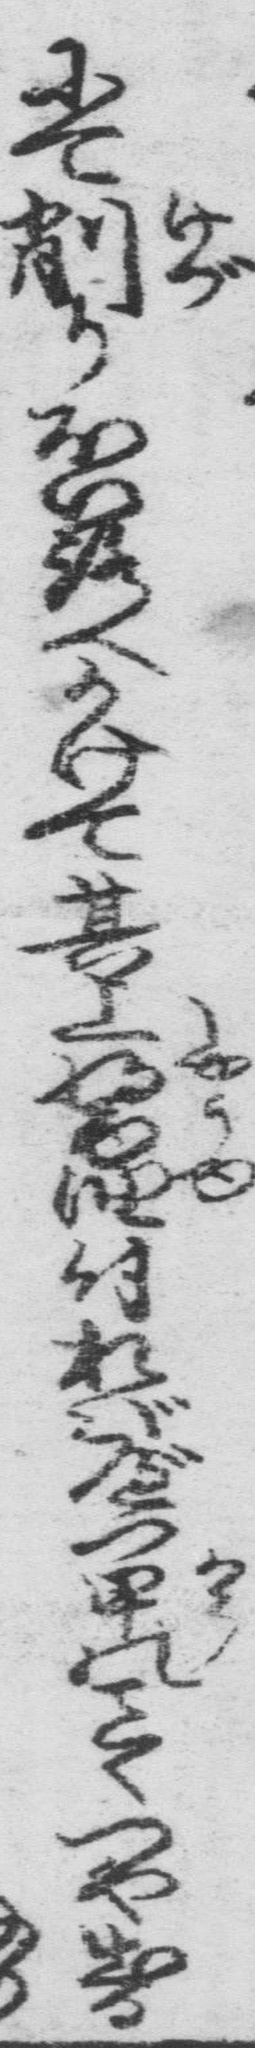にて削りほいろへかけて其上醤油付ればべつ甲のことくつや出るなり
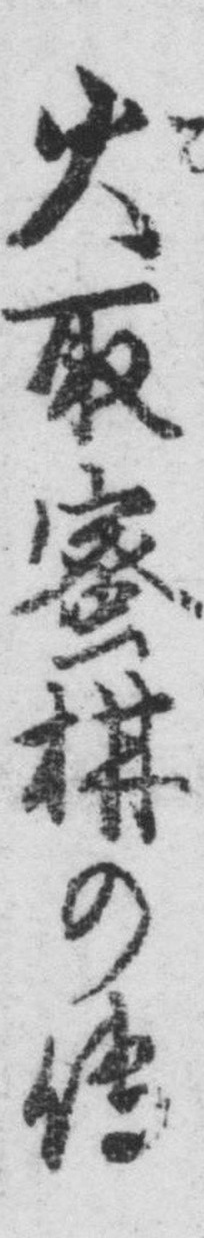火取蜜柑の伝
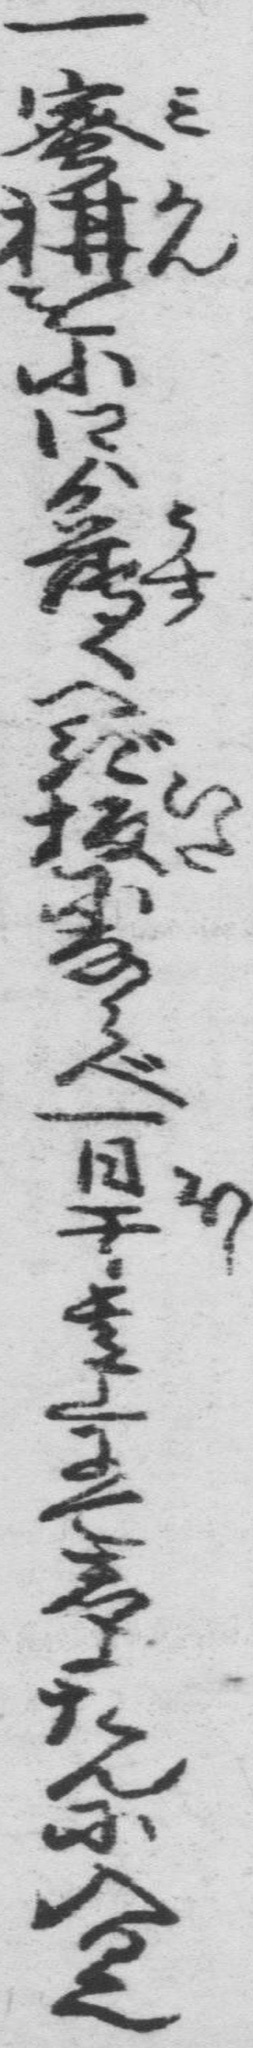一蜜柑を小口ゟ薄くへぎ板にならべ一日干し其上にてしよたんに入る也
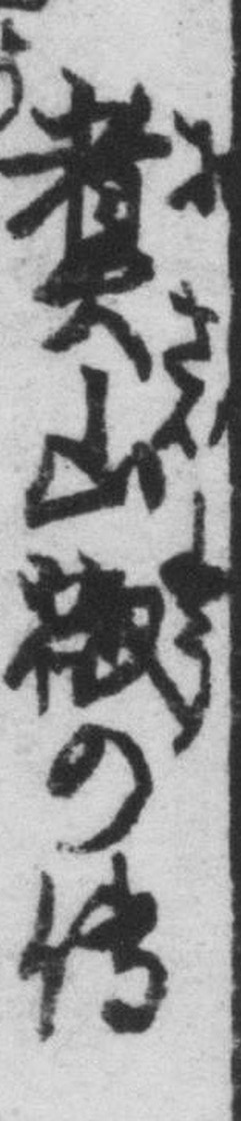煮山椒の伝
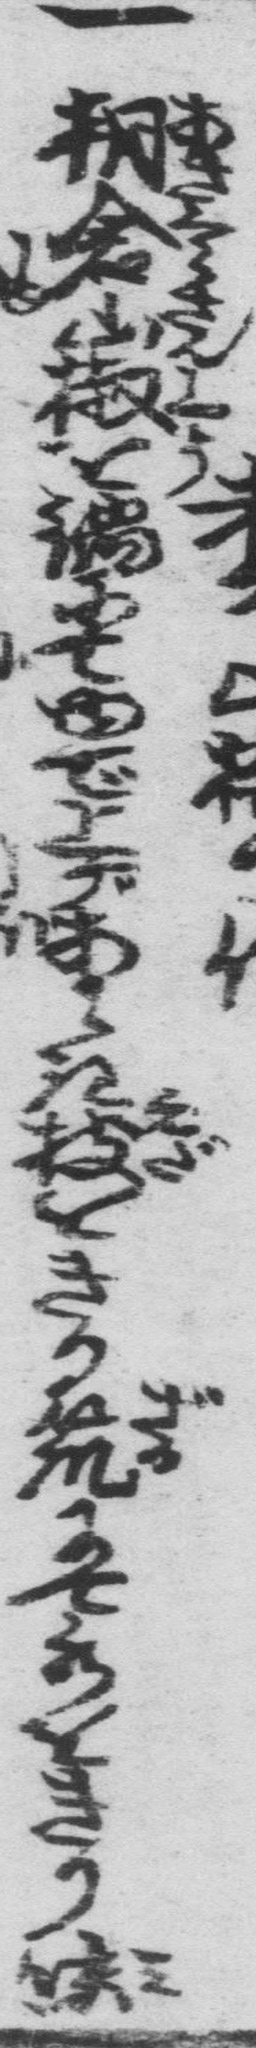一朝倉山椒を鍋にてゆで上げあらき枝をきり笊にて水をきり味
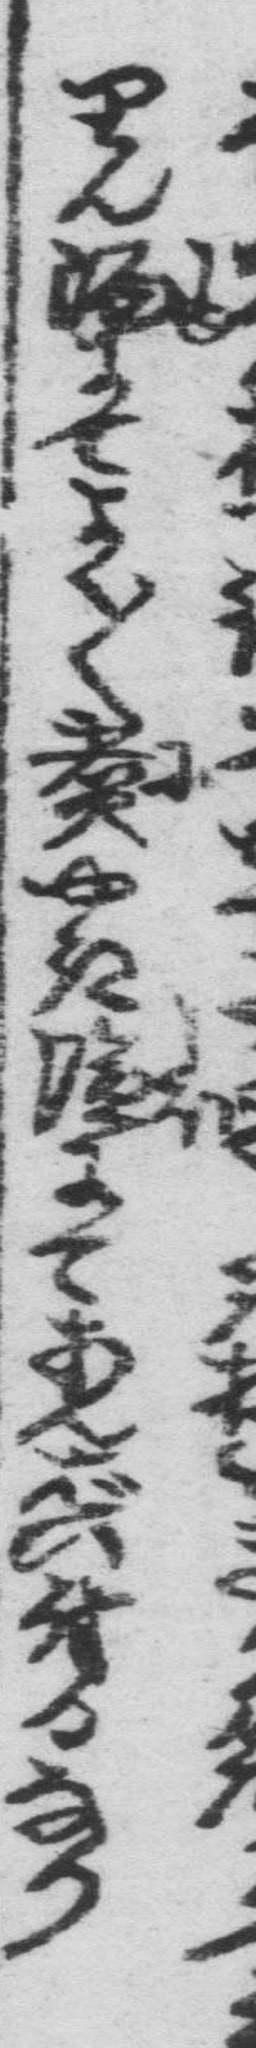りん酒にてよく〳〵煮やき塩にてあんばい付るなり
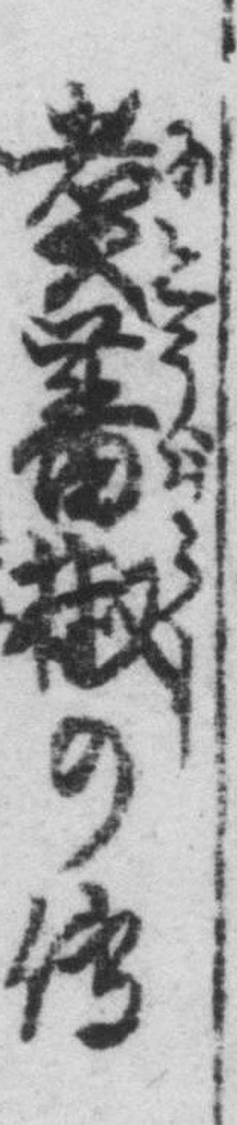煮蕃椒の伝
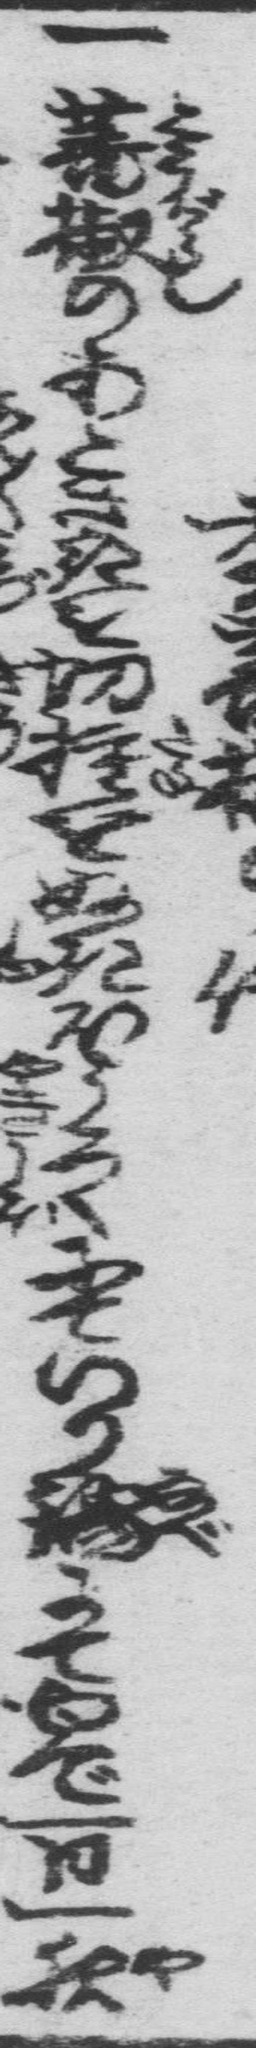一蕃椒のあとさきを切種をぬきほうろくにていり鍋にてゆで一日一夜
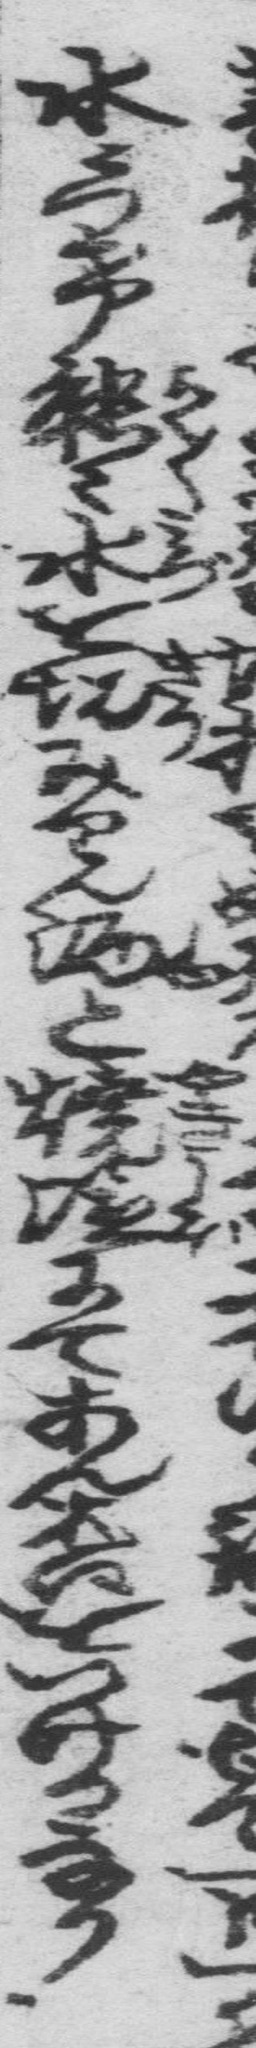水につけ能々水を切みりん酒と焼塩にてあんばいをつけるなり
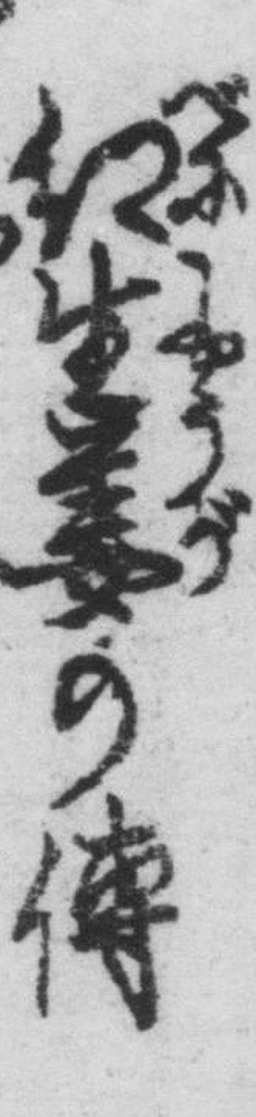紅生姜の伝
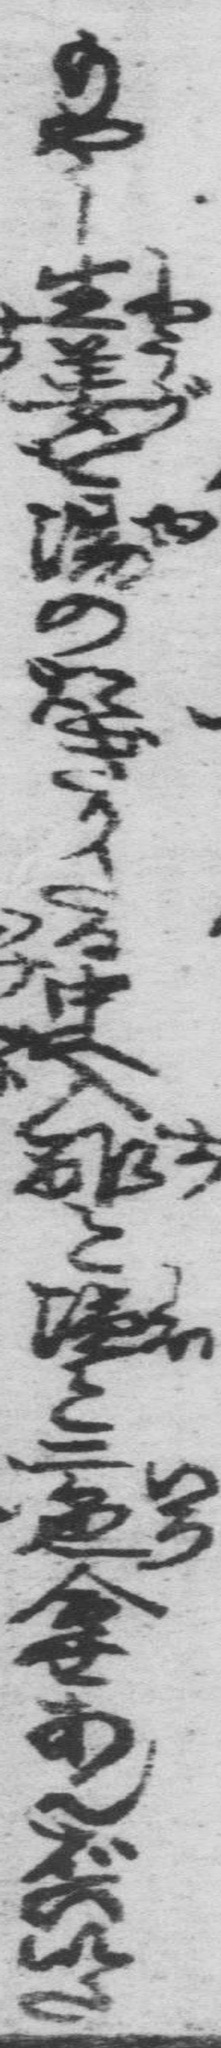一もやし生姜を湯のたぎりたる中へ入酢と塩と二色合せあんばいいた
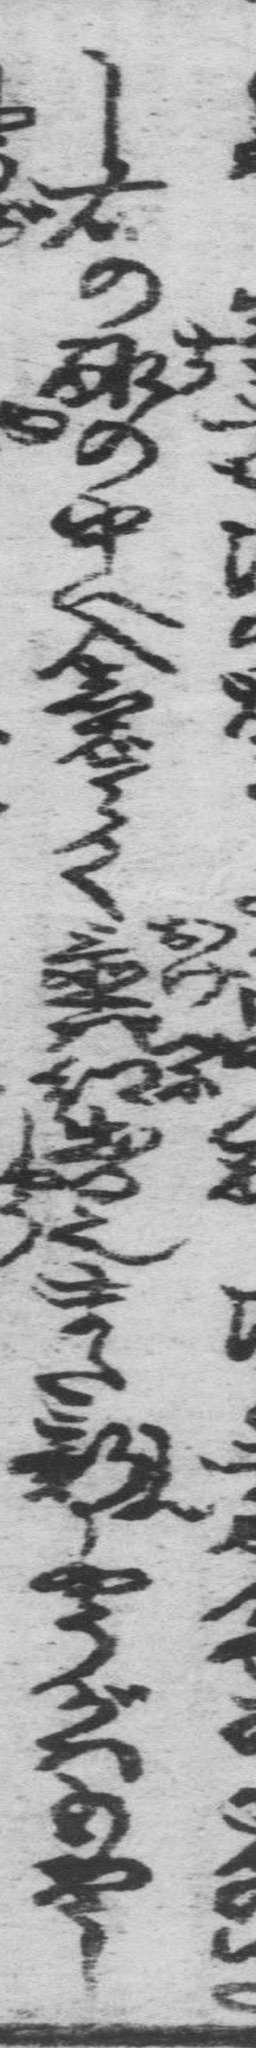し右の酢の中へ入しばらく置ば紅出る也また新しやうがはもやし
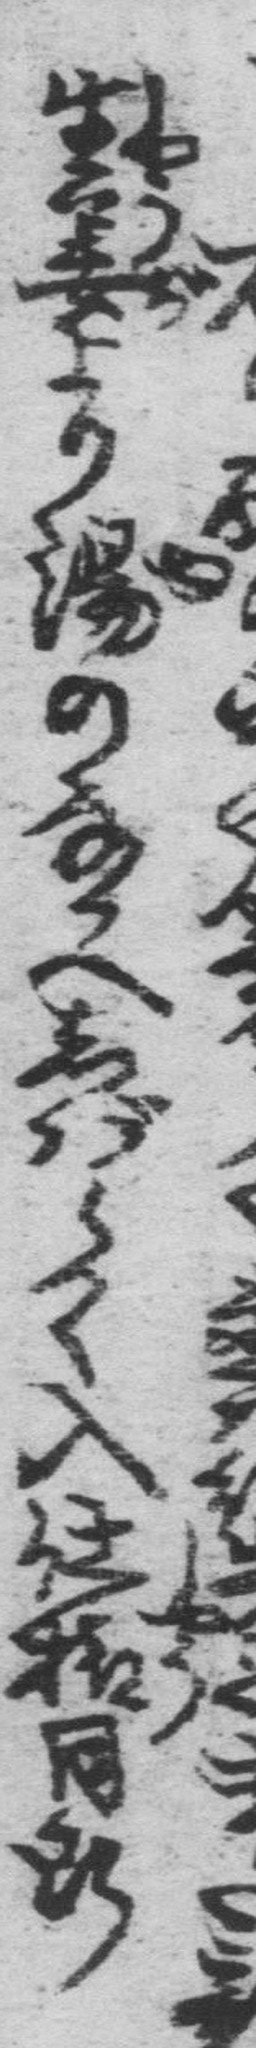生姜より湯のなかへしばらく入仕様同断
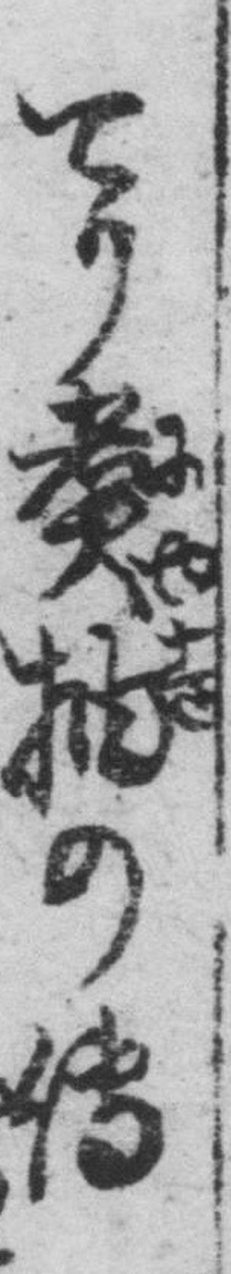てり煮柚の伝
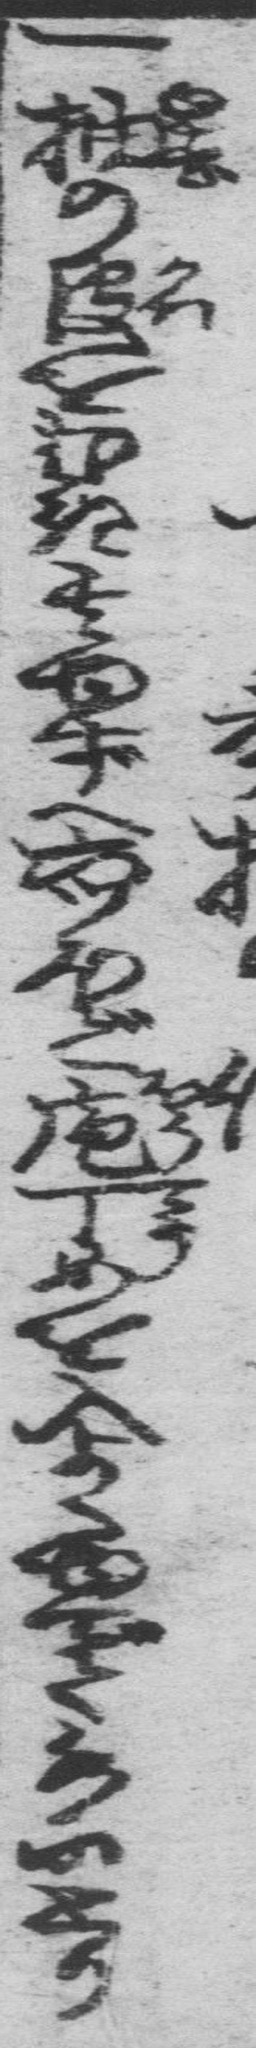一柚の皮をむき其ゆずへ六ツほど包丁を入よくゆでゝ水にとり

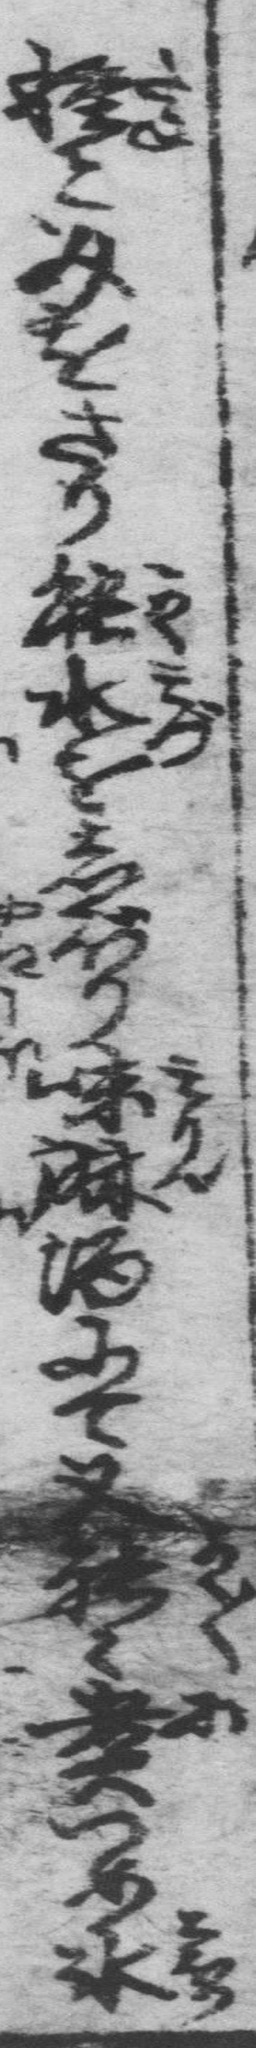種とみをさり能水をしぼり味痳酒にて又能々煮つめ氷
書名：即席庖丁
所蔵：大阪府立大学学術情報センター 国文学研究資料館
